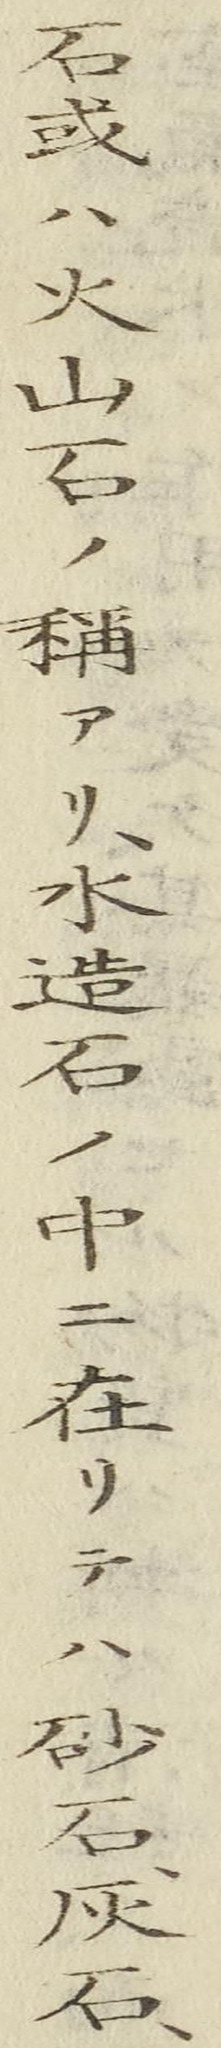石或ハ火山石ノ称アリ、水造石ノ中ニ在リテハ砂石、灰石、
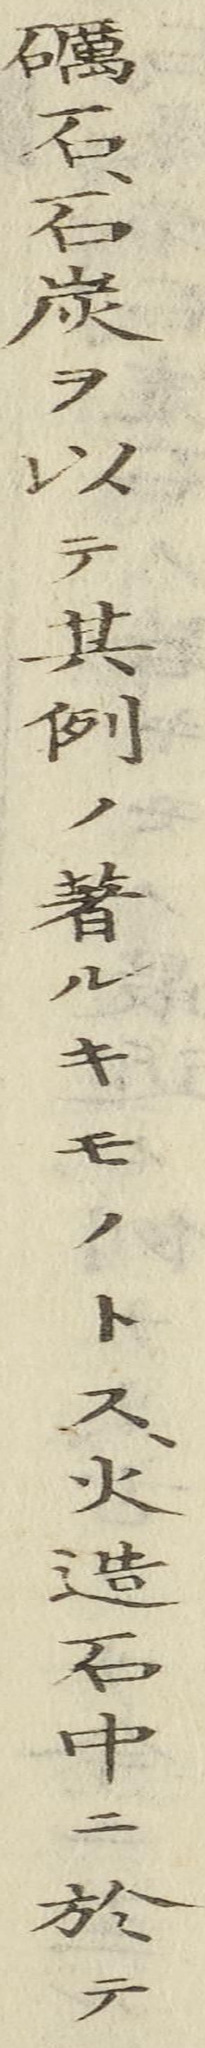鉱石、石炭ヲ以テ其例ノ著ルキモノトス、火造石中ニ於テ

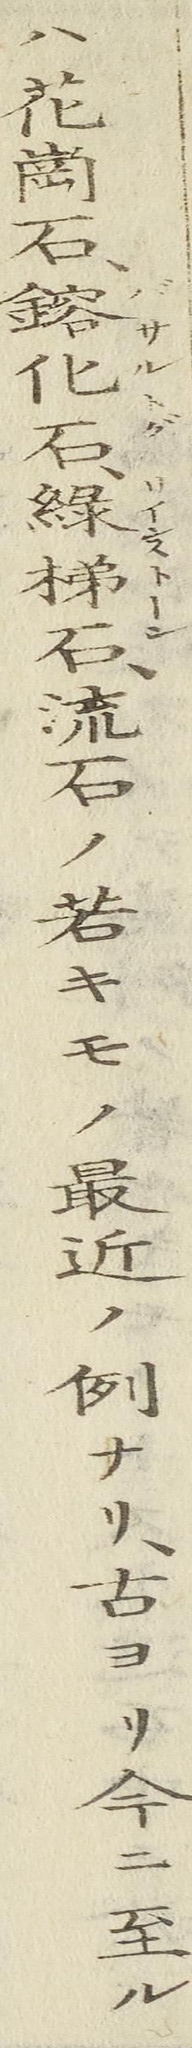ハ花崗石、鎔化石、緑梯石、流石ノ若キモノ最近ノ例ナリ、古ヨリ今ニ至ル
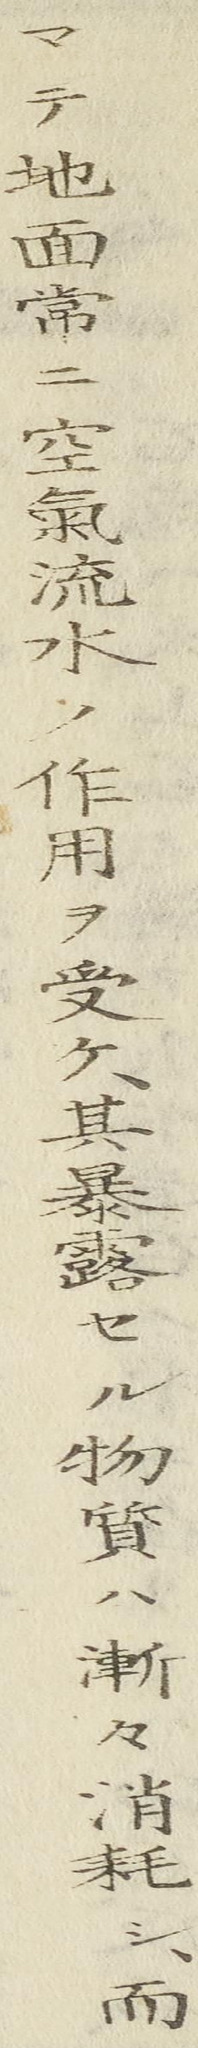マテ地面常ニ空気流水ノ作用ヲ受ケ、其暴露セル物質ハ漸々消耗シ、而
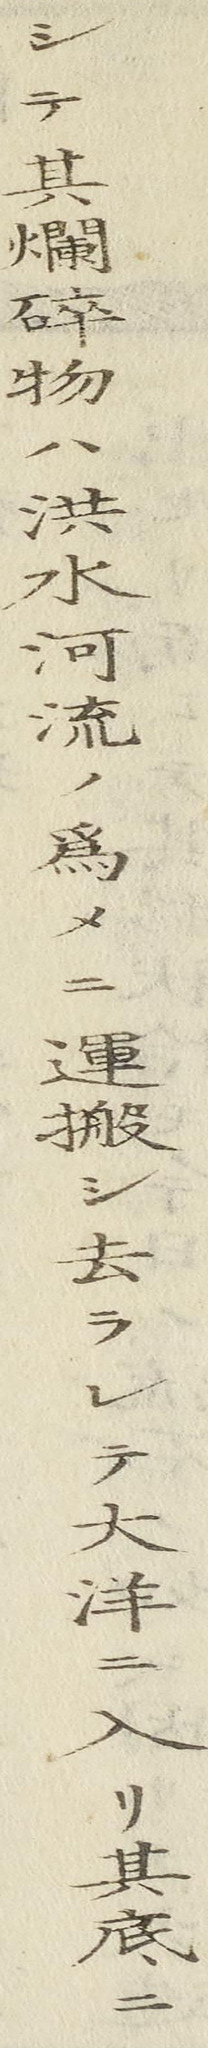シテ其爛砕物ハ洪水河流ノ為メニ運搬シ去ラレテ大洋ニ入リ其底ニ
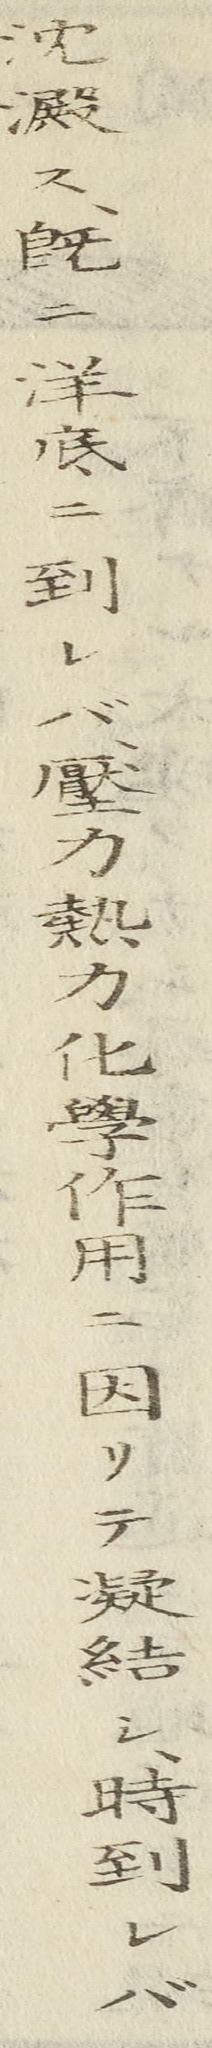沈殿ス、既ニ洋底ニ到レバ、圧力熱力化学作用ニ因リテ凝結シ、時到レバ
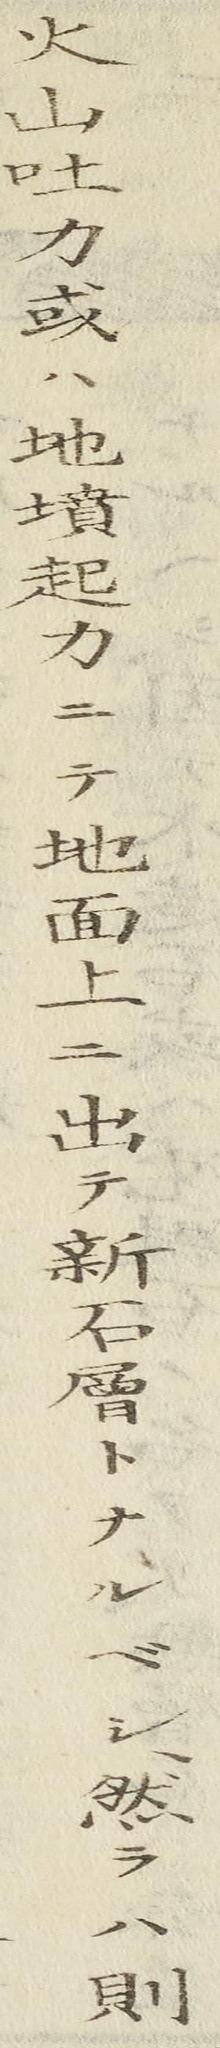火山吐力或ハ地墳起力ニテ地面上ニ出テ新石層トナルベシ、然ラハ則
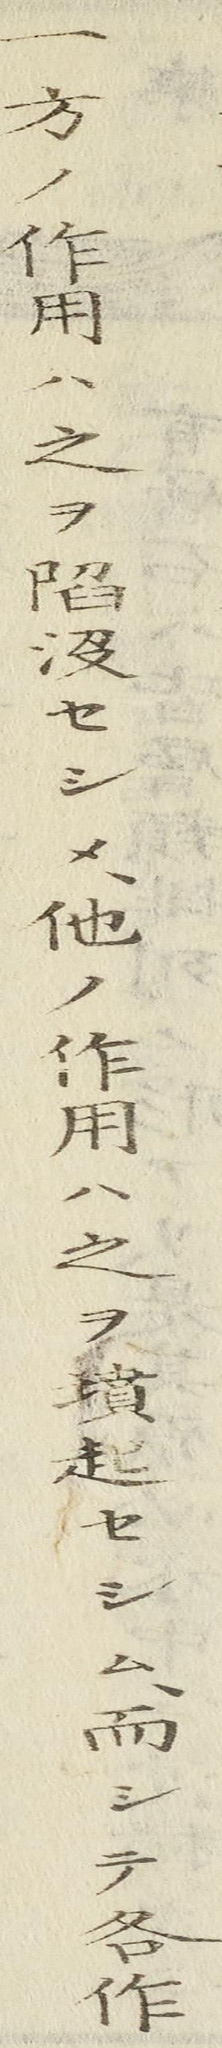一方ノ作用ハ之ヲ陥没セシメ、他ノ作用ハ之ヲ墳起セシム、而シテ各作
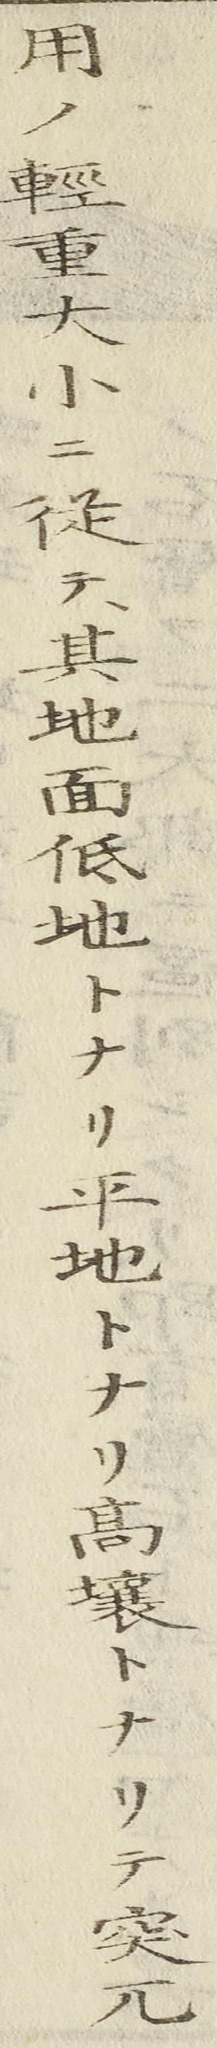用ノ軽重大小ニ従テ、其地面低地トナリ平地トナリ高壌トナリテ突兀
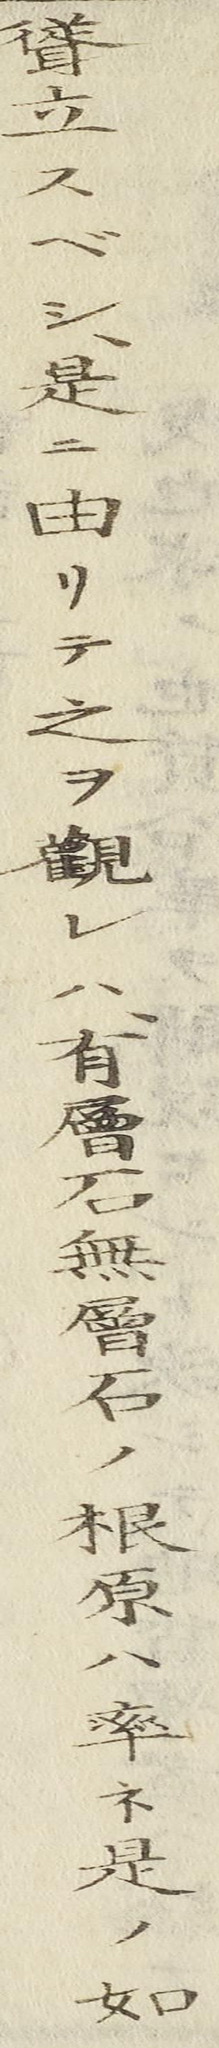聳立スベシ、是ニ由リテ之ヲ観レハ、有層石無層石ノ根原ハ率ネ是ノ如
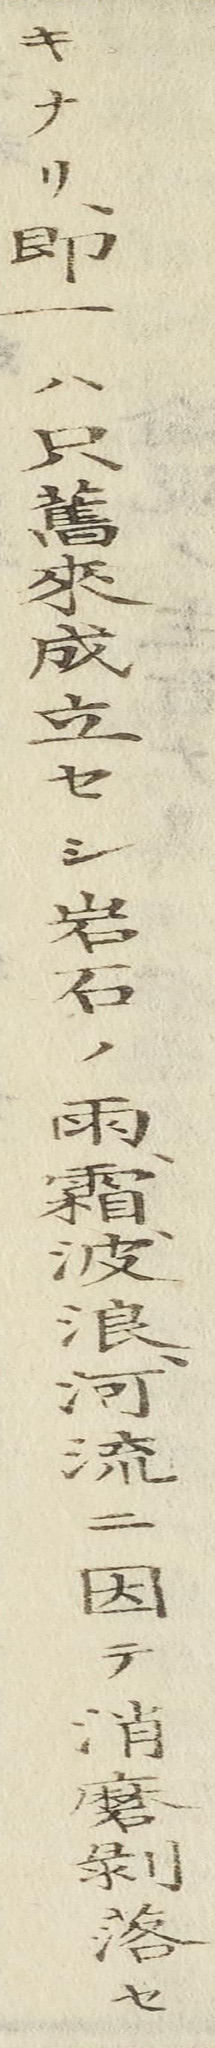キナリ、即一ハ只旧来成立セシ岩石ノ雨、霜、波浪、河流ニ因テ消磨剥落セ
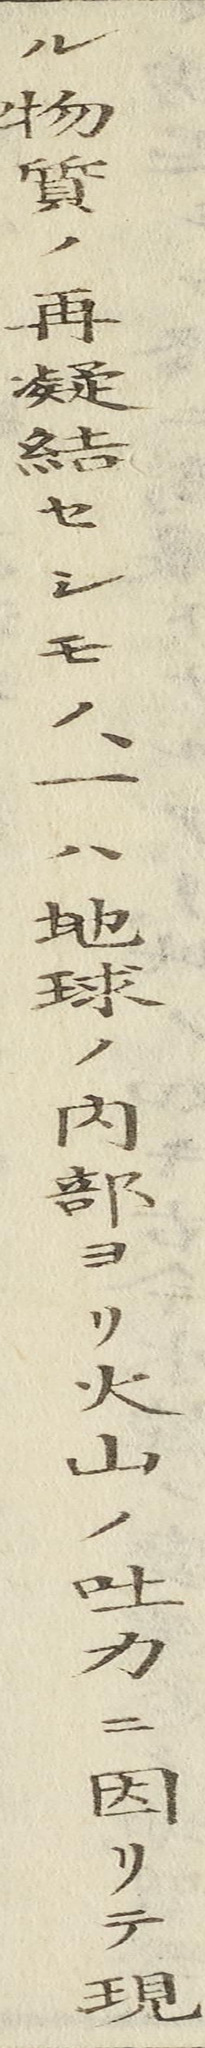ル物質ノ再凝結セシモノ、一ハ地球ノ内部ヨリ火山ノ吐力ニ因リテ現
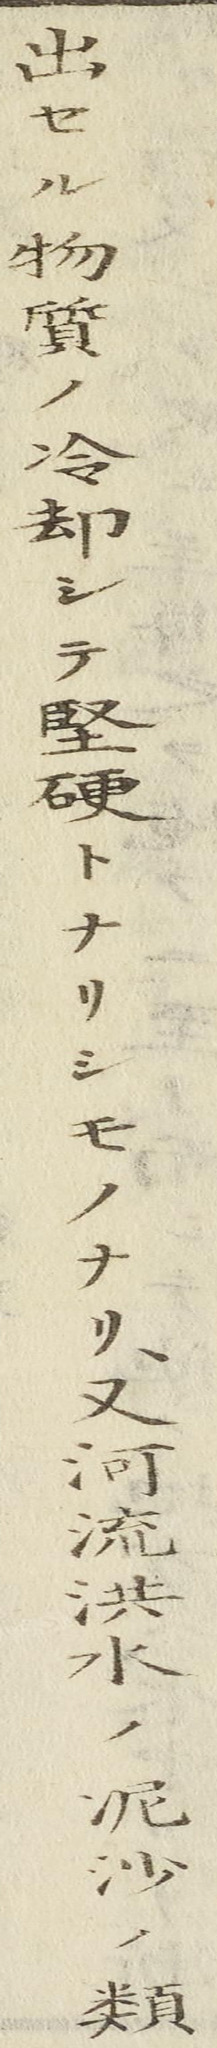出セル物質ノ冷却シテ堅硬トナリシモノナリ、又河流洪水ノ泥沙ノ類
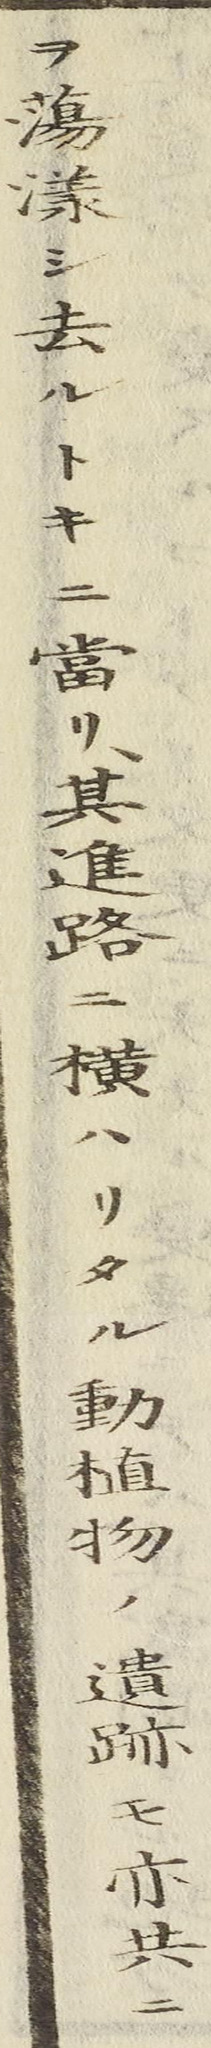ヲ蕩漾シ去ルトキニ当リ、其進路ニ横ハリタル動植物ノ遺跡モ亦共ニ
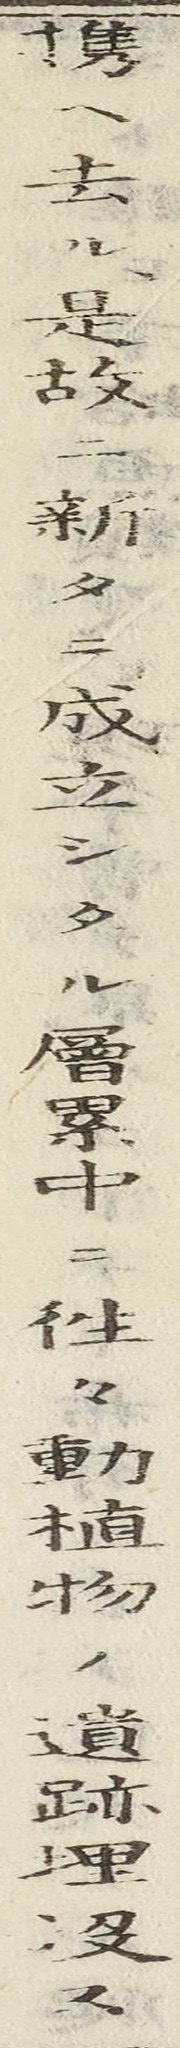携ヘ去ル、是故ニ新タニ成立シタル層累中ニ往々動植物ノ遺跡埋没ス
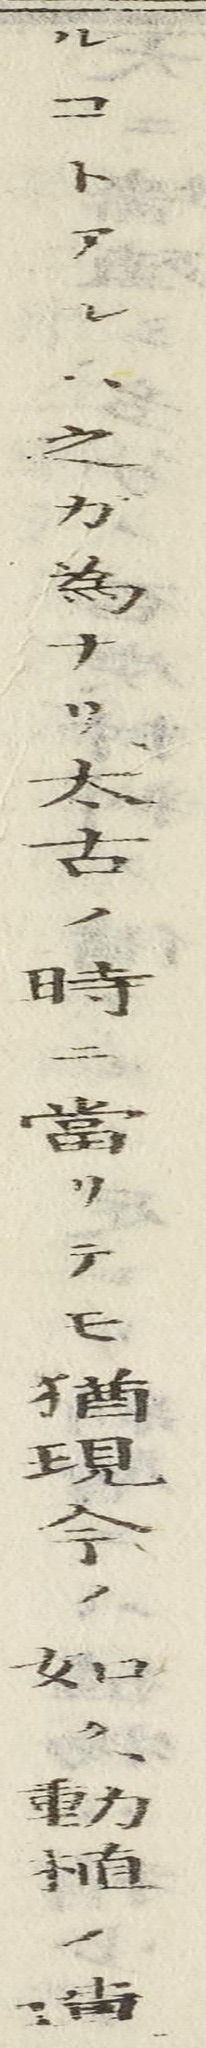ルコトアレハ之ガ為ナリ、太古ノ時ニ当リテモ猶現今ノ如ク、動植ノ遺
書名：百科全書　地文學　全
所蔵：東京大学地震研究所図書室 Earthquake Research Institute Library, The University of Tokyo, JAPAN
